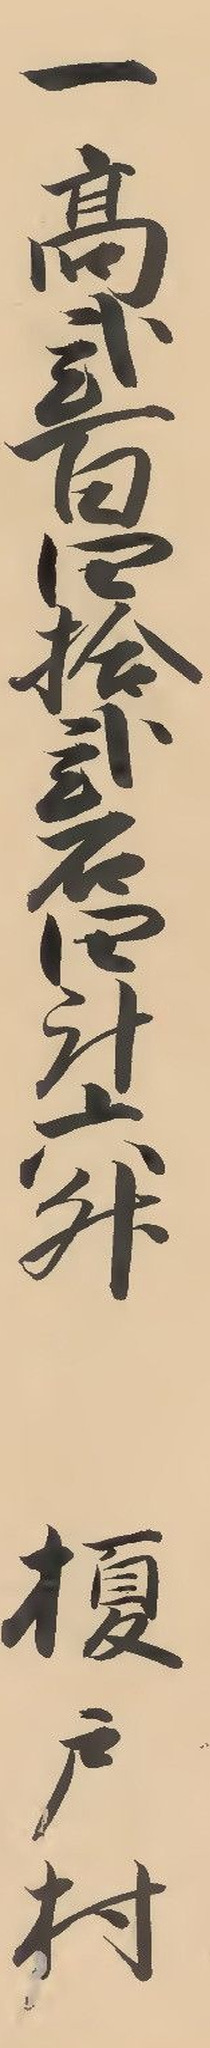一高弐百四拾弐石四斗六升榎戸村
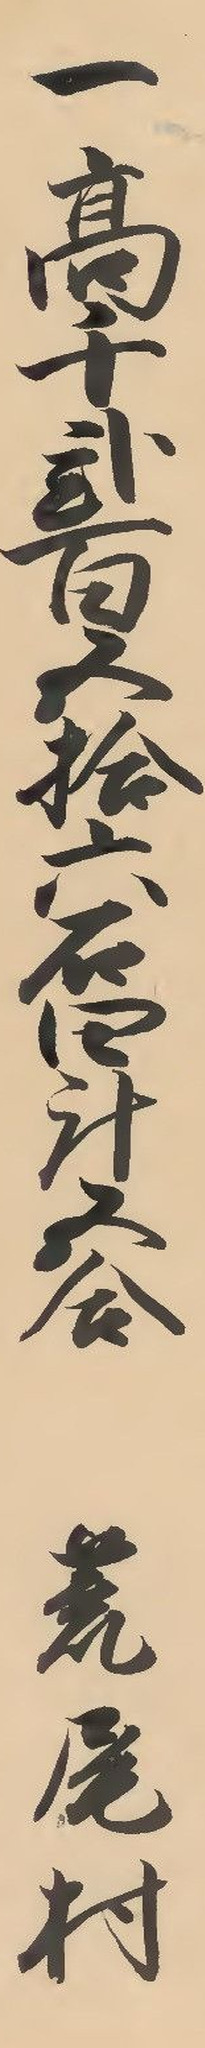一高千弐百五拾六石四斗五合荒尾村

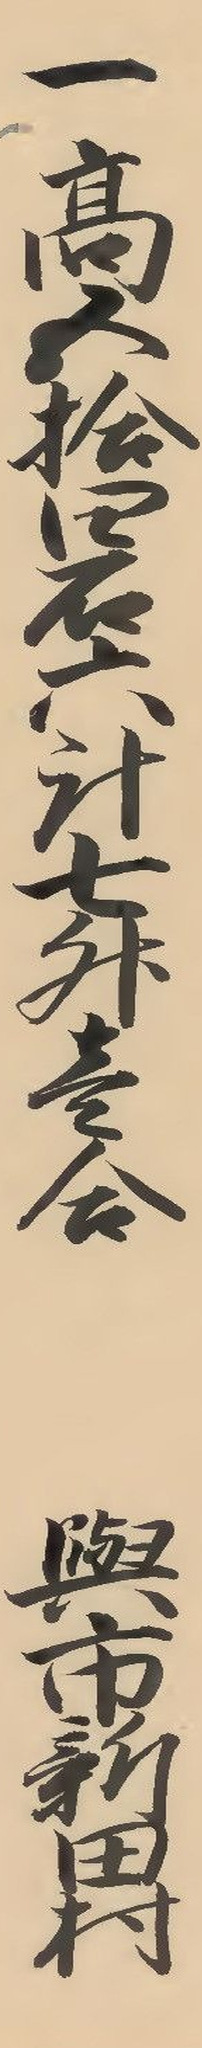一高五拾四石六斗七升壱合与市新田村
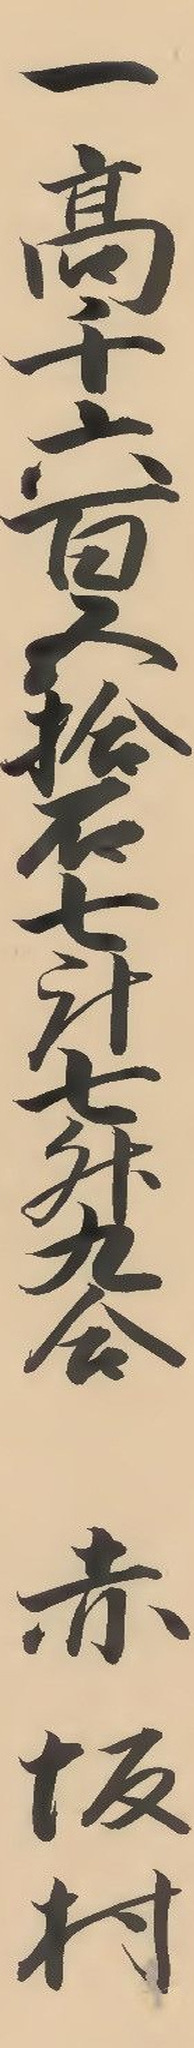一高千六百五拾石七斗七升九合赤坂村
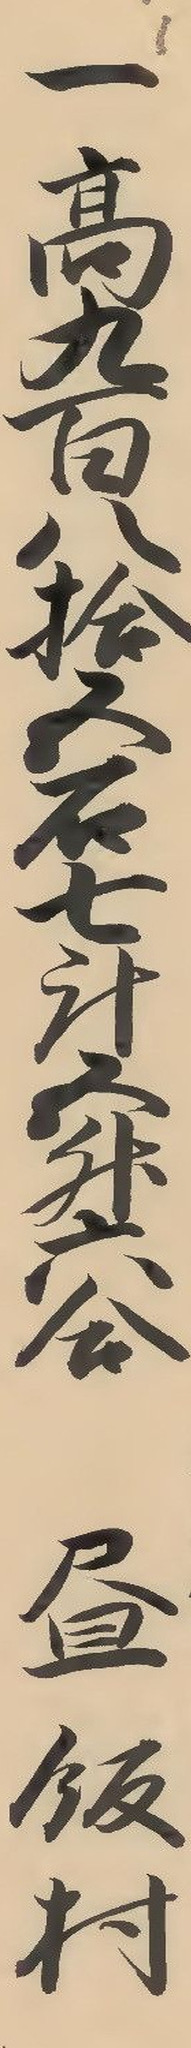一高九百八拾五石七斗五升六合昼飯村
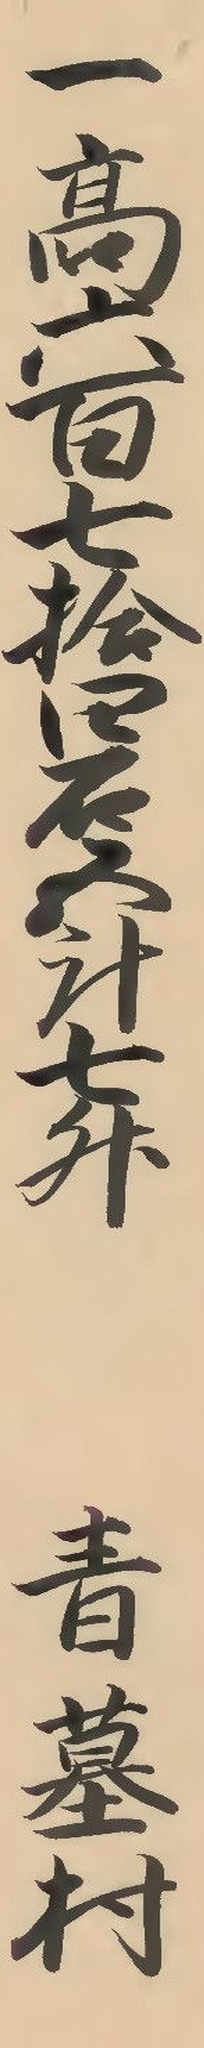一高六百七拾四石五斗七升青墓村
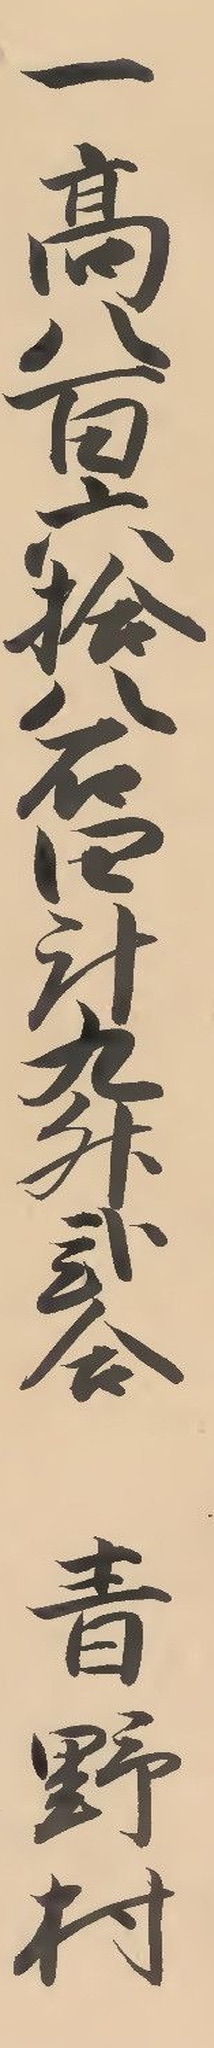一高八百六拾八石四斗九升弐合青野村
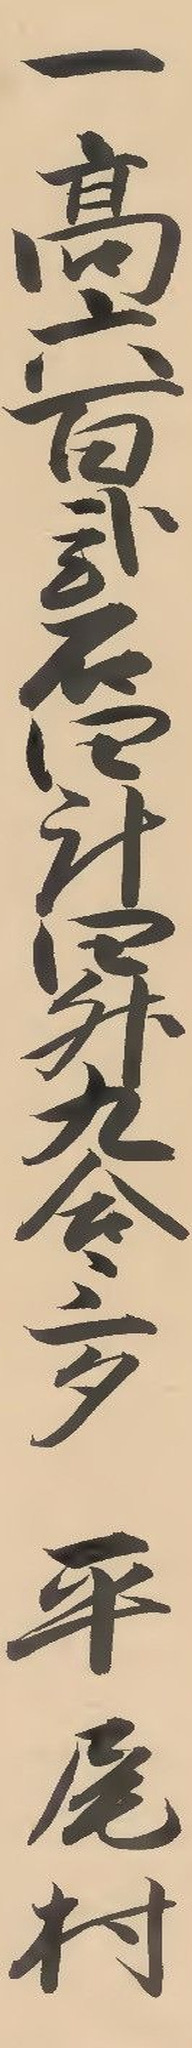一高六百弐石四斗四升九合三勺平尾村
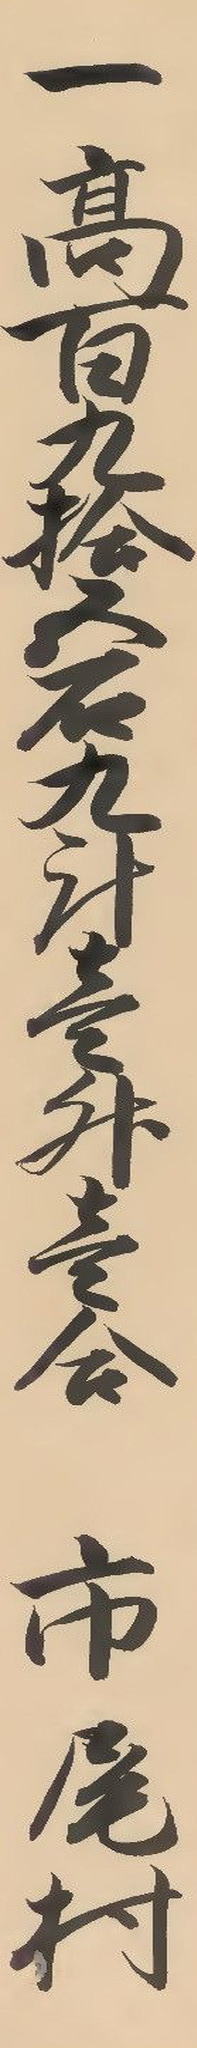一高百九拾五石九斗壱升壱合市尾村
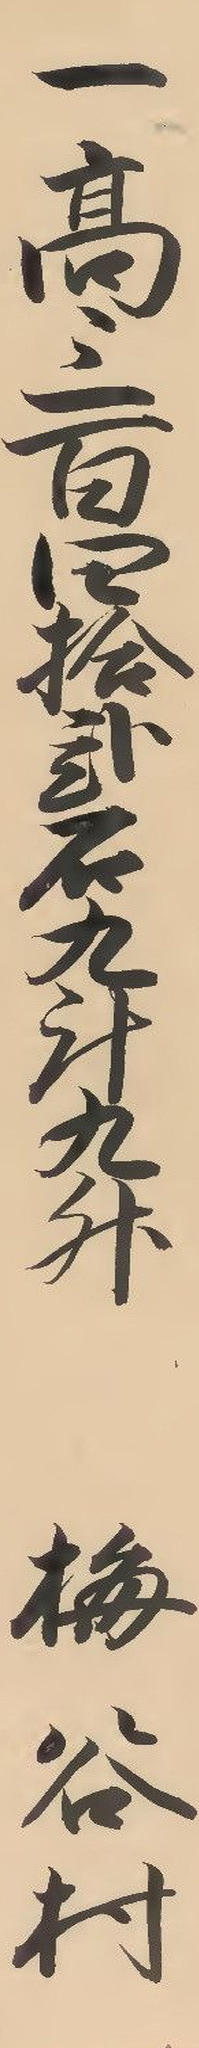一高三百四拾弐石九斗九升梅谷村

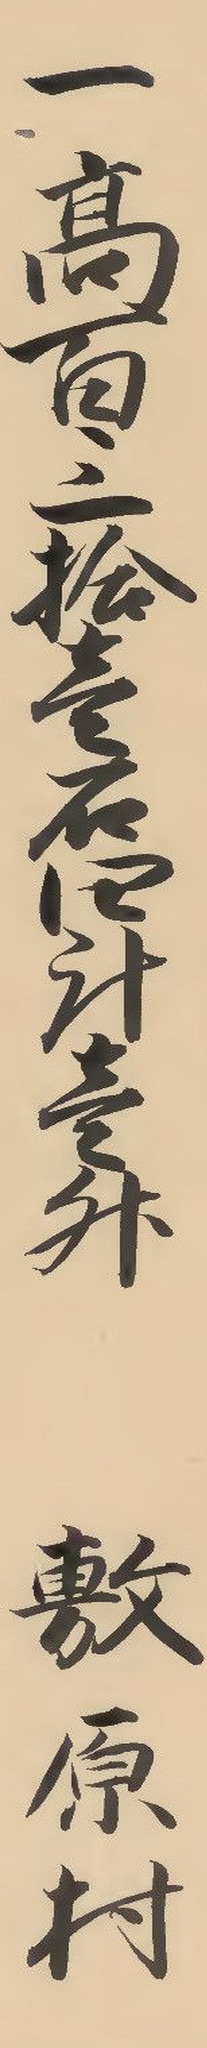一高百三拾壱石四斗壱升敷原村
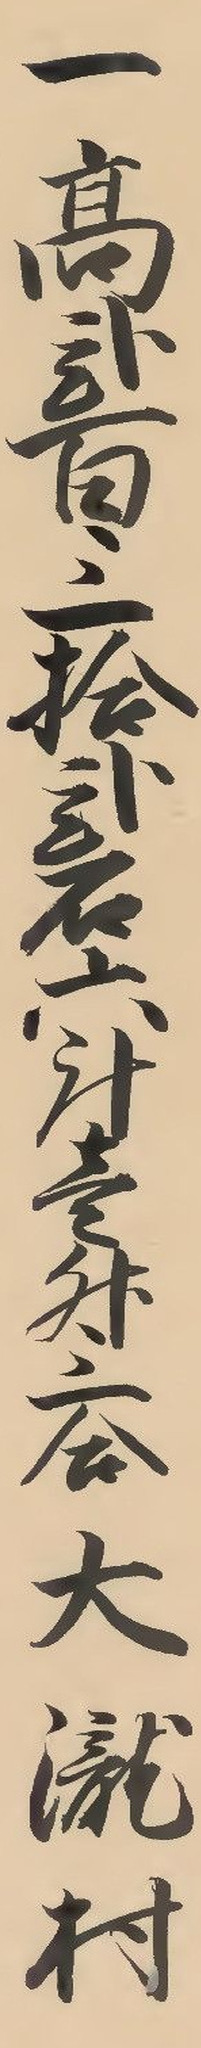一高弐百三拾弐石六斗壱升三合大瀧村
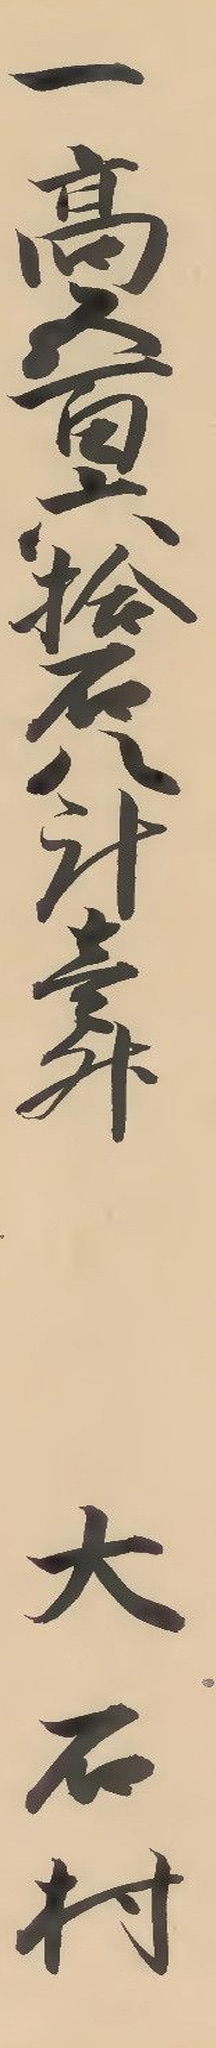一高五百六拾石八斗壱升大石村
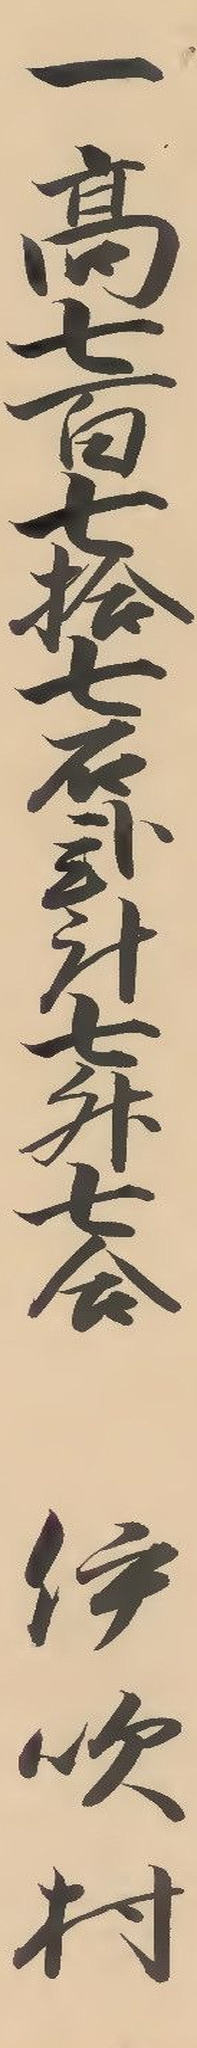一高七百七拾七石弐斗七升七合伊吹村
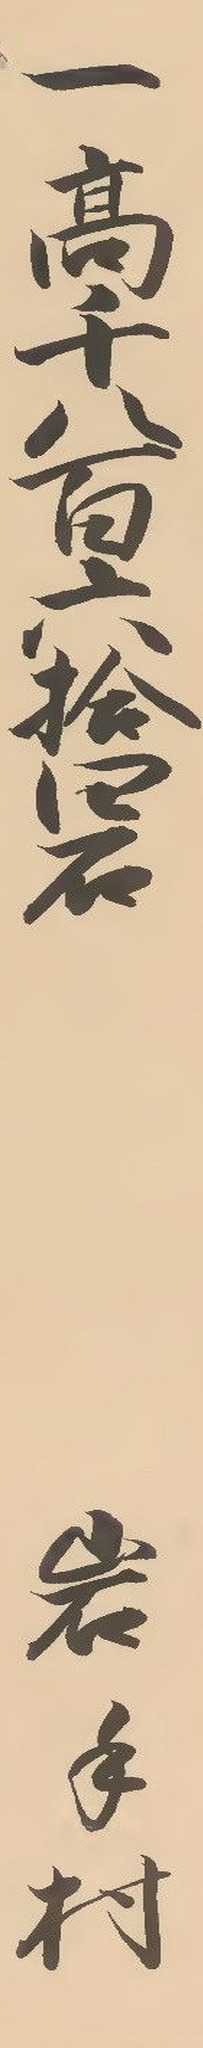一高千八百六拾四石岩手村
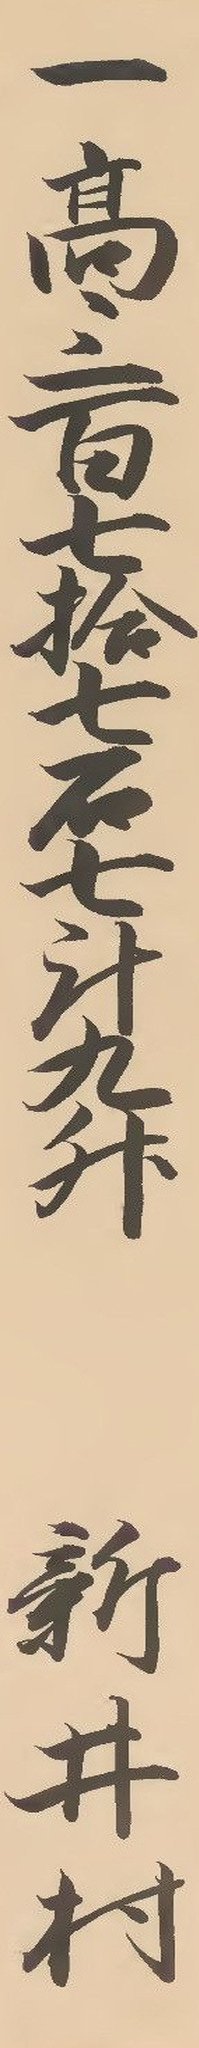一高三百七拾七石七斗九升新井村
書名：美濃国郷帳
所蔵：国立公文書館 National Archives of Japan
